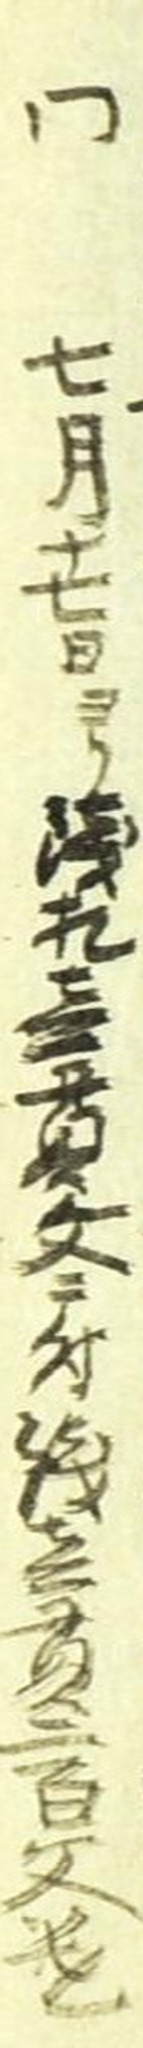同七月十七日ヨリ銭札壱貫文ニ付銭壱貫二百文遣

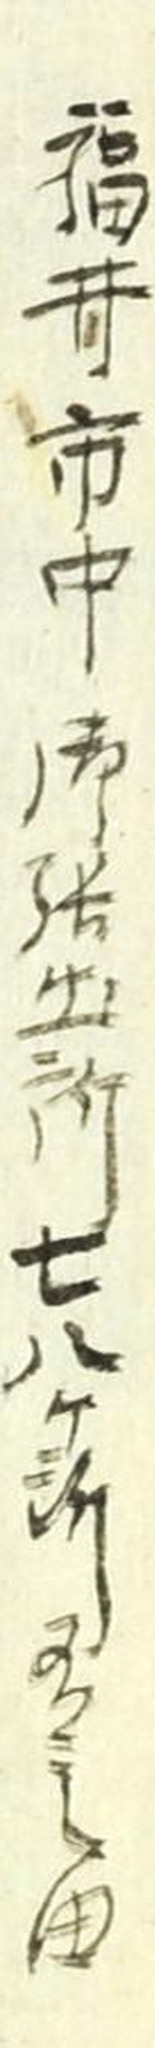福井市中御出張所七八ヶ所有之由
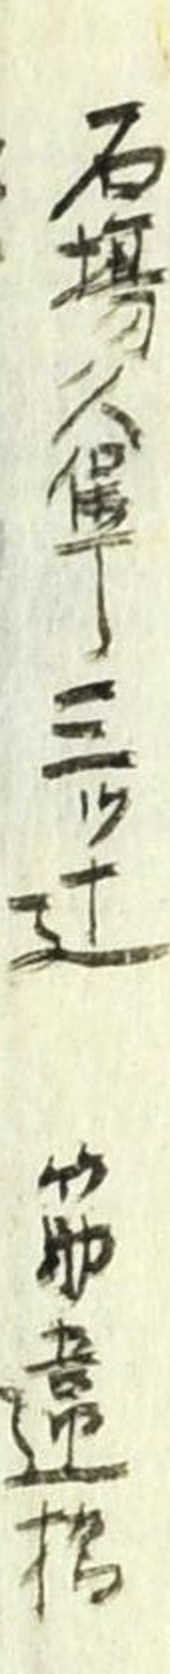石場久保丁三ツ辻筋違橋
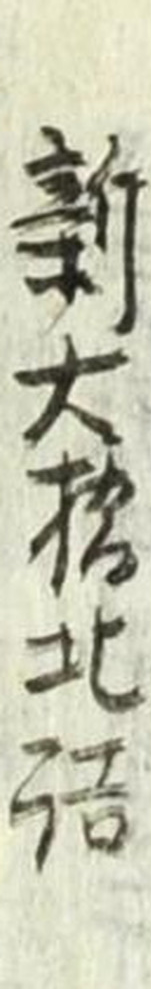新大橋北詰
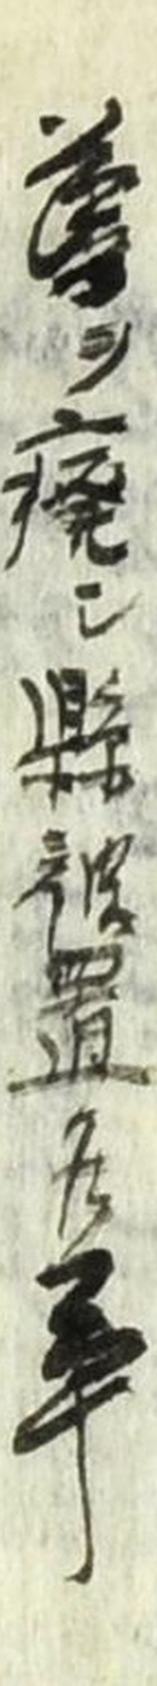藩ヲ廃シ県被置候事
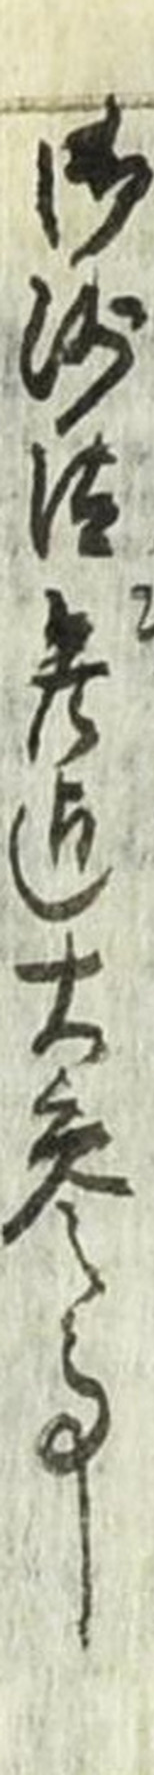御沙汰候迄大参事
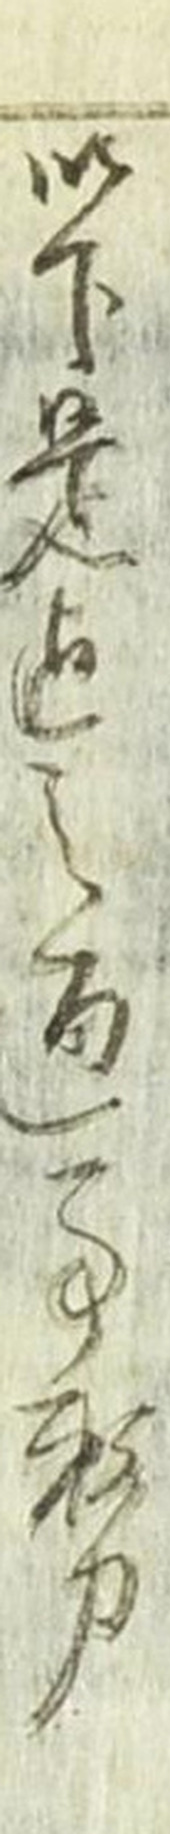以下是迄之通事務
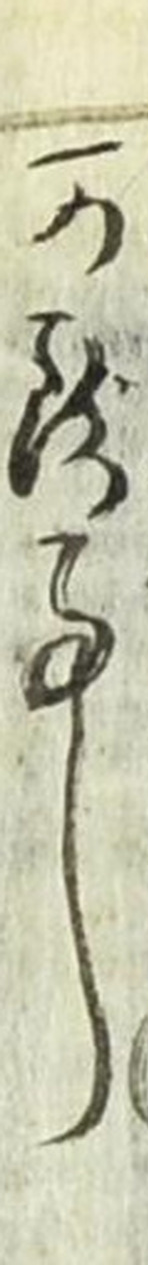可致事
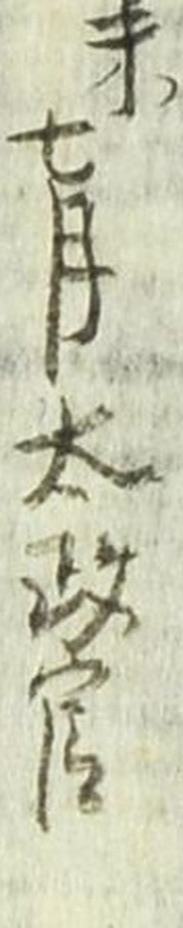七月太政官
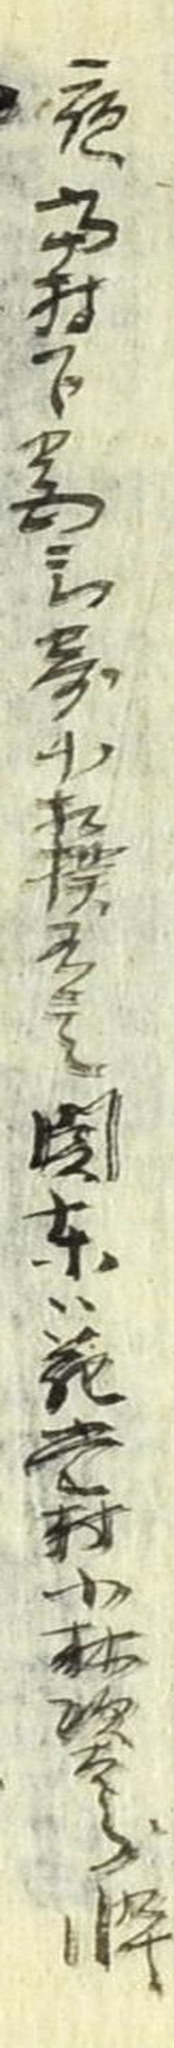夜当村下宮ニ而寄小相撲有之関東ハ花堂村小林次太郎倅
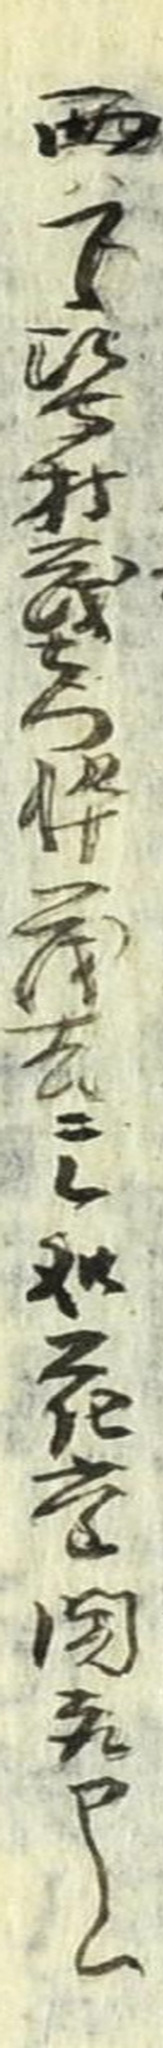西ハ下江守村茂右衛門倅茂吉ニ候処花堂関取申候
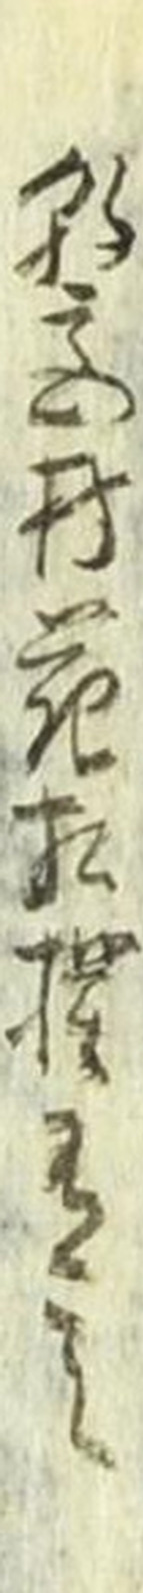朝宮村花相撲有之
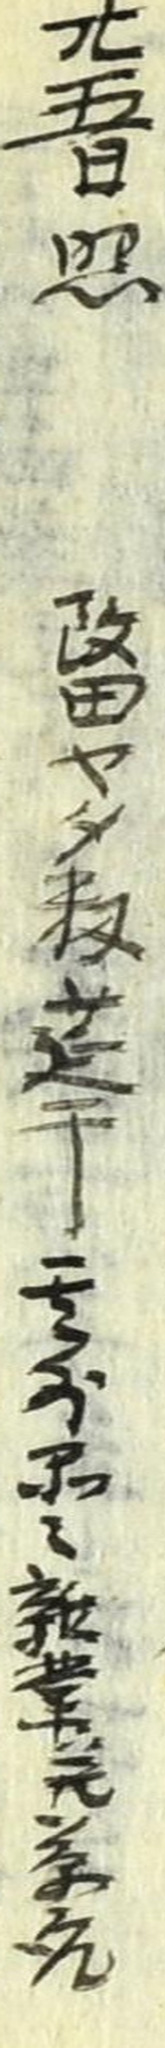廿五日照改田ヤタ籾莚干其外品々雑業幷草取
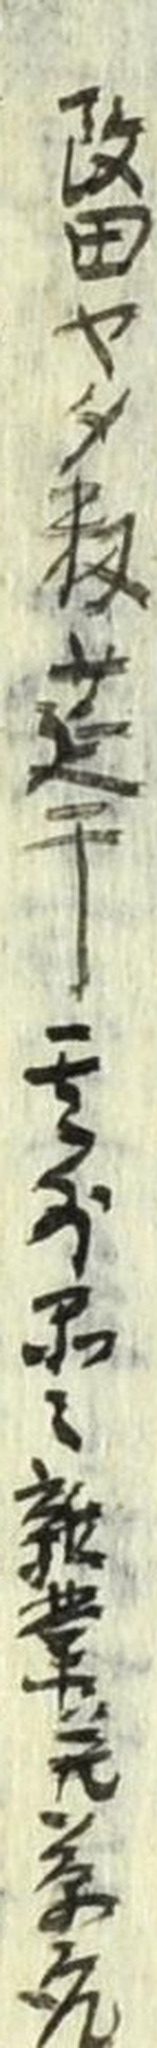廿五日照改田ヤタ籾莚干其外品々雑業幷草取
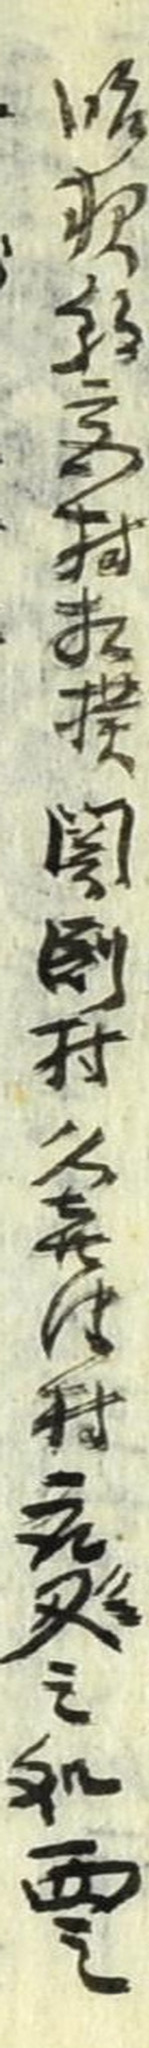昨夜朝宮村相撲関淵村久喜村取叉之処西之
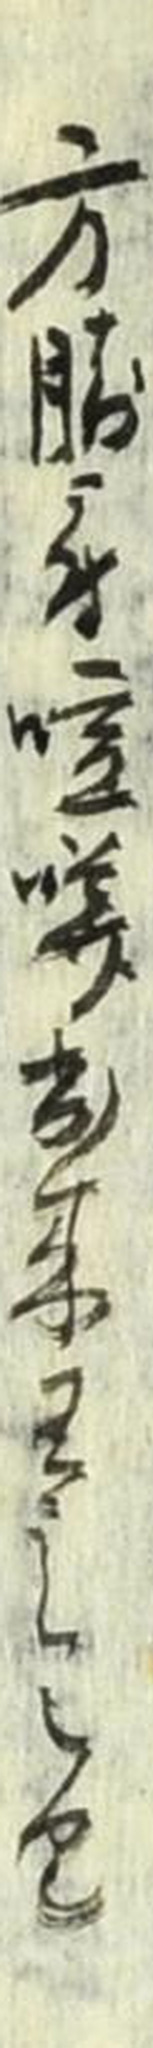方勝ニ付喧嘩出来有之候由
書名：（日記）
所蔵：福井県文書館 Fukui Prefectural Archives
